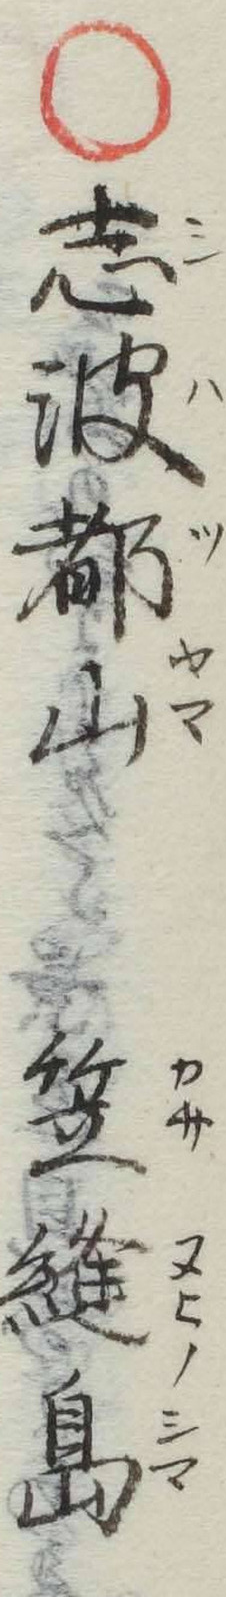○志波都山笠縫島
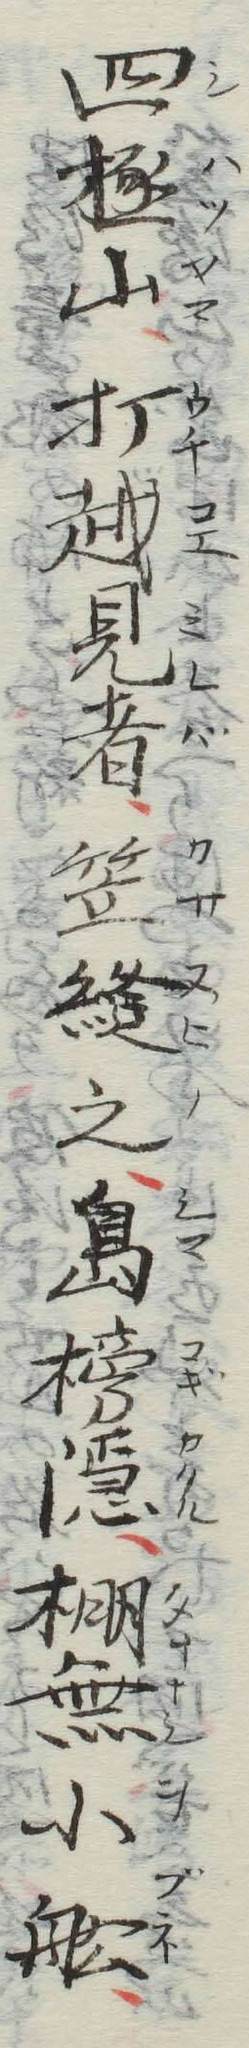四極山、打越見者、笠縫之、島榜隠、棚無小船、
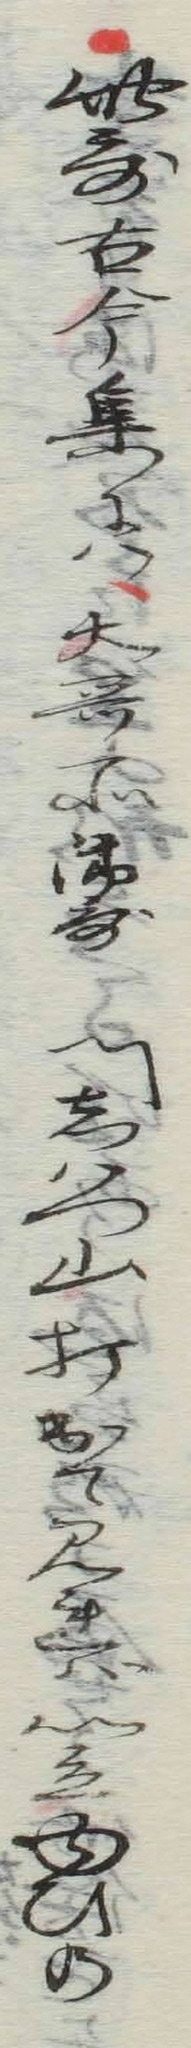●此歌古今集には、大歌所御歌〽しはつ山打出て見れば笠ゆひの
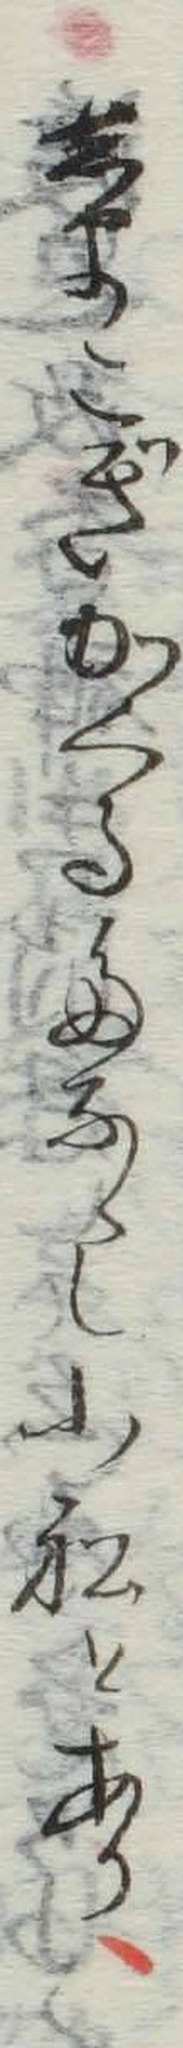しまこぎかくるたなゝし小船とあり、
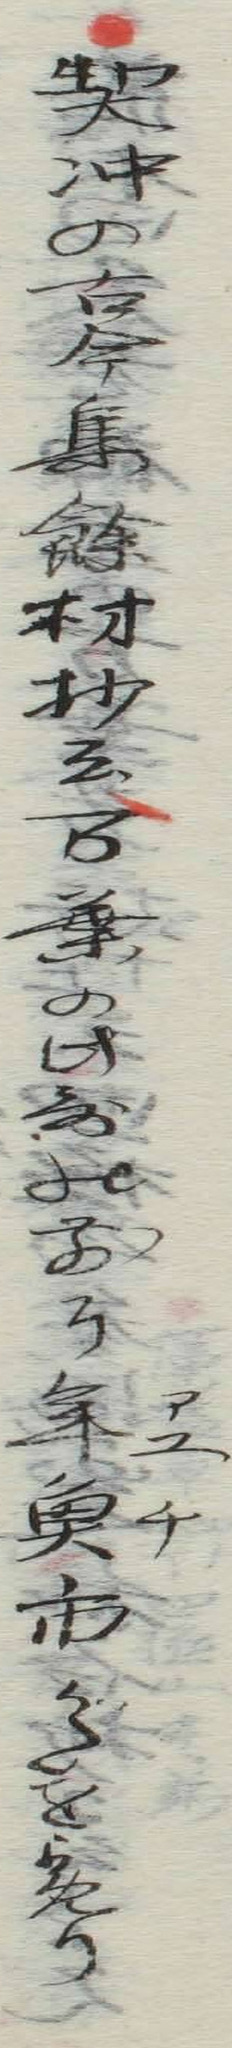●契冲の古今集餘材抄云、万葉の此歌の前に年魚市がたをよめり
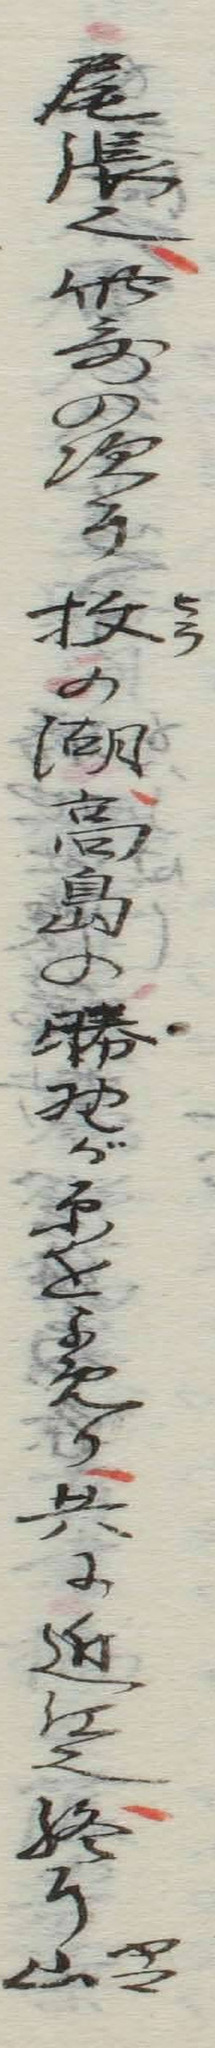尾張也、此歌の次に枚の湖、高島の勝野が原をよめり、共に近江也、終に山
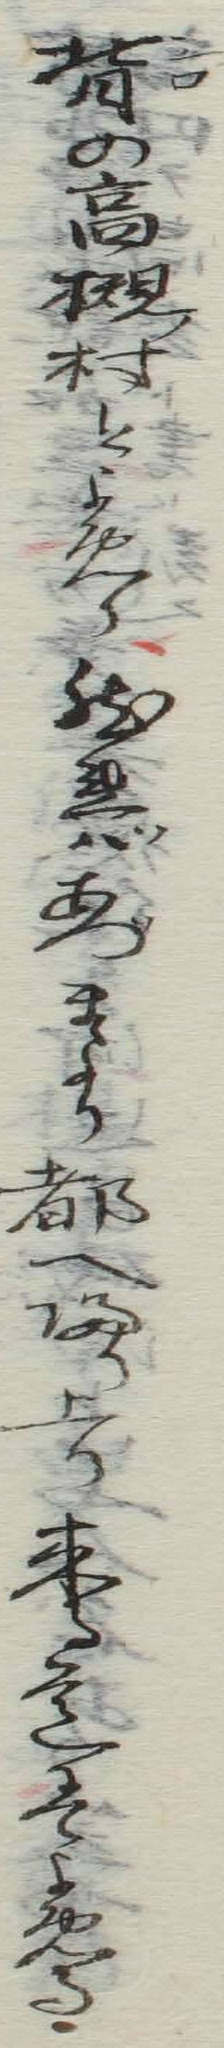背の高槻村とよめり、然ればあづまより都へ帰り上り来る道にてよめる
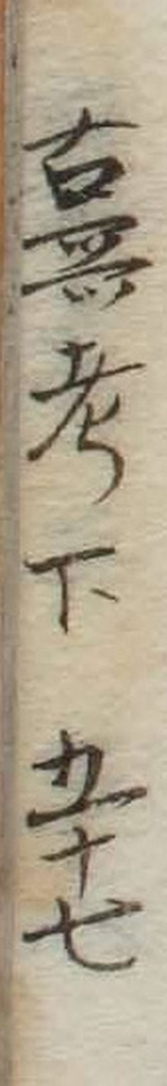古歌考下五十七

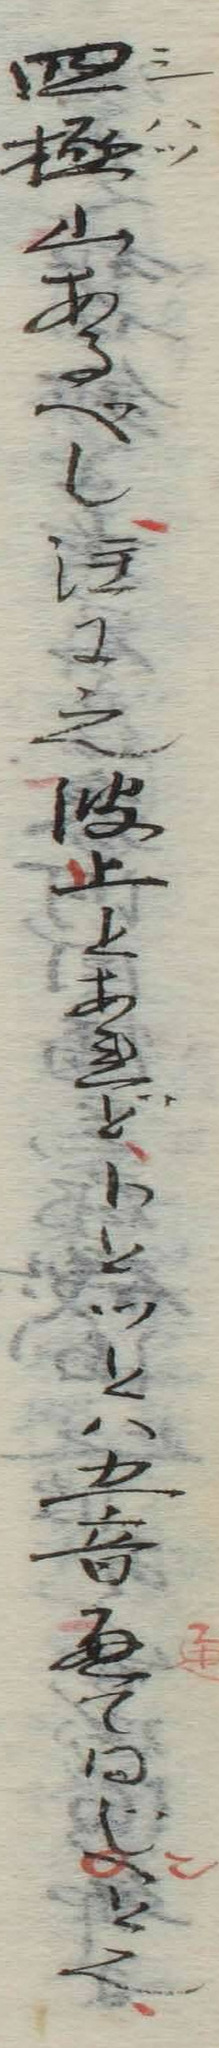四極山あるべし、注に之波止とあれど、トとツとは五音通て同じこと也、
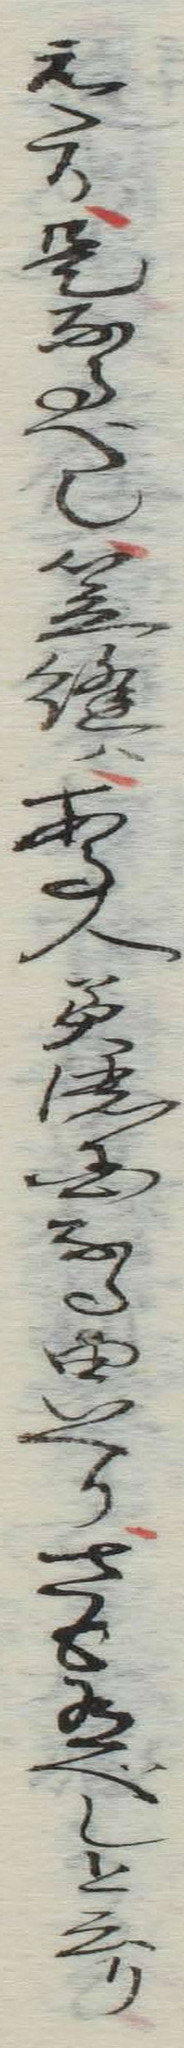えたり、是なるべし、笠縫は、ある人美濃国なる由いへり、さも有べしと云り
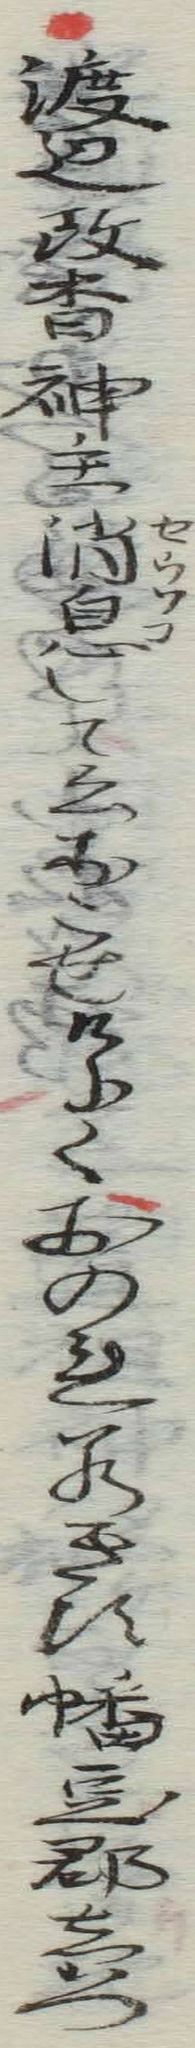●渡辺政杳神主消息して云おこせけらく、おのれ若き頃幡豆郡しはつ
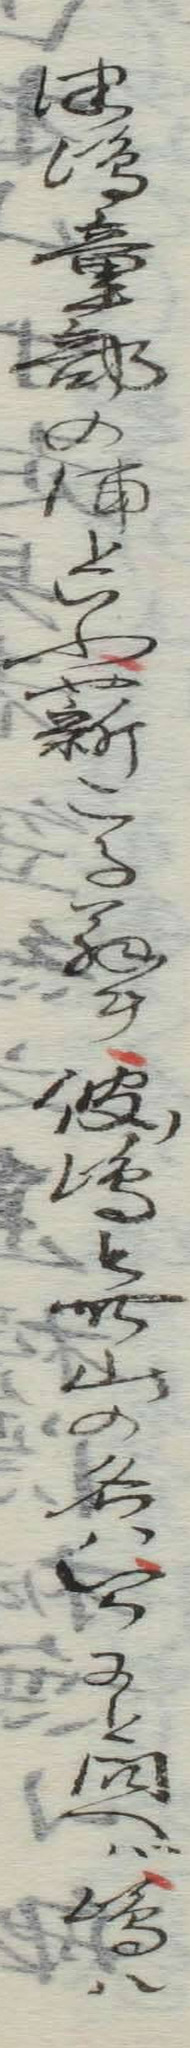津嶋童部の浦といふ、薪こる翁に、彼島と此山の名は、いかにと問へば、島は
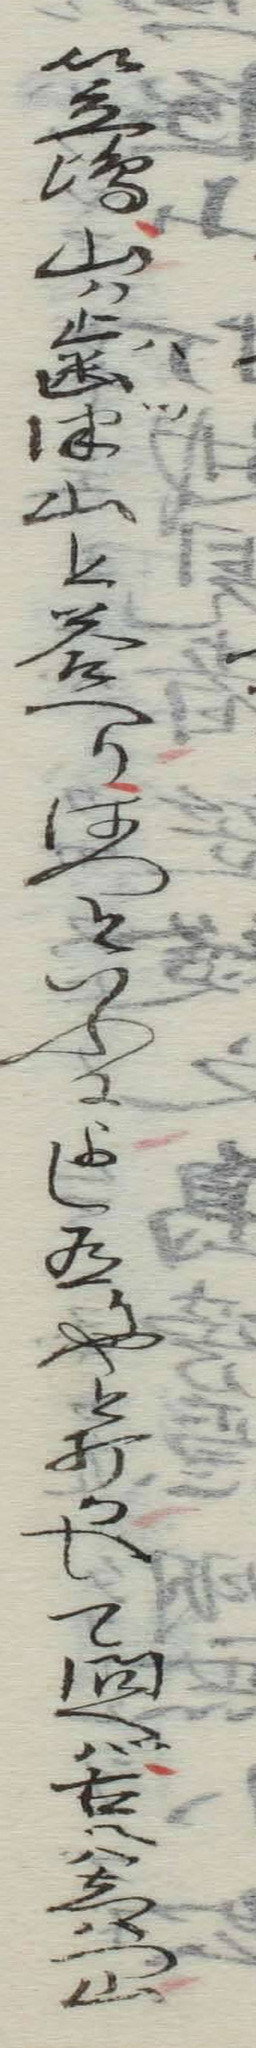笠嶋、山は歯津山と答へり、はつといふによし有りやと打かへして問へば、古へはしはつ山
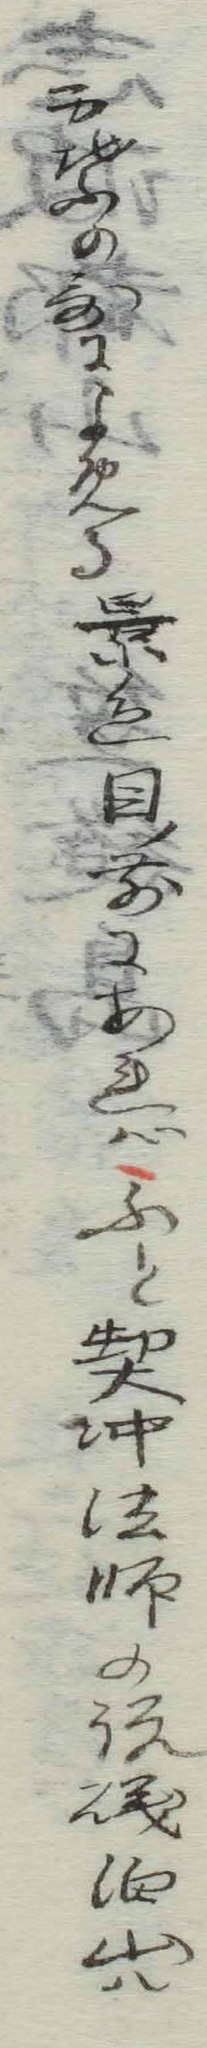万葉の歌によめる景色目前にあれば、ふと契冲法師の説磯泊山は
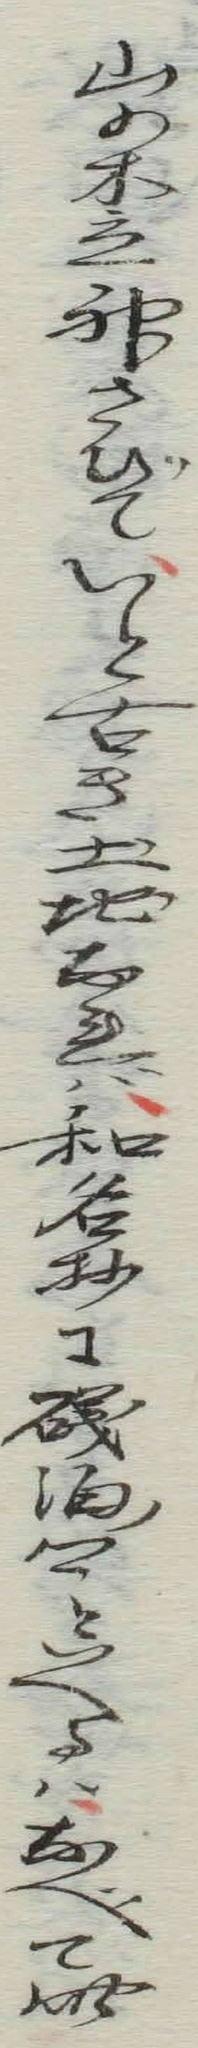山の木立神さびて、いと古き土地なれば、和名称に磯泊郷といへるは、なべて此
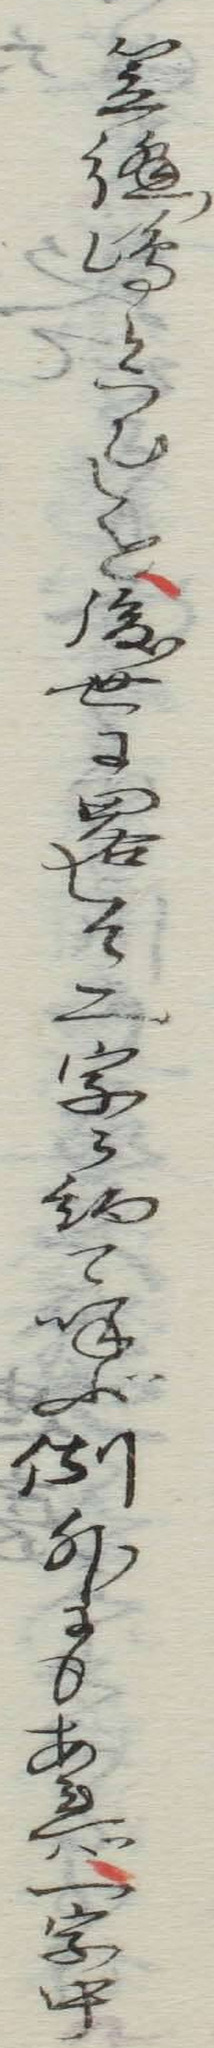笠縫嶋といひしを、後世に略して二字に約て呼ぶ例外にもあれば、一字中
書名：三河国古跡考
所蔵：国文学研究資料館
